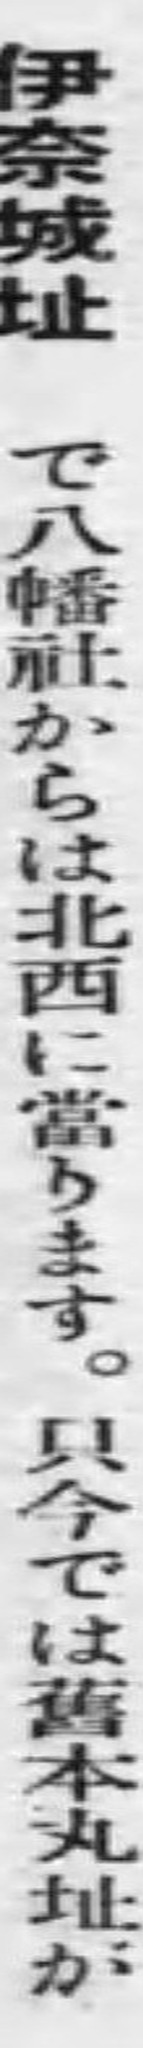伊奈城址で八幡社からは北西に当ります。只今では旧本丸址が
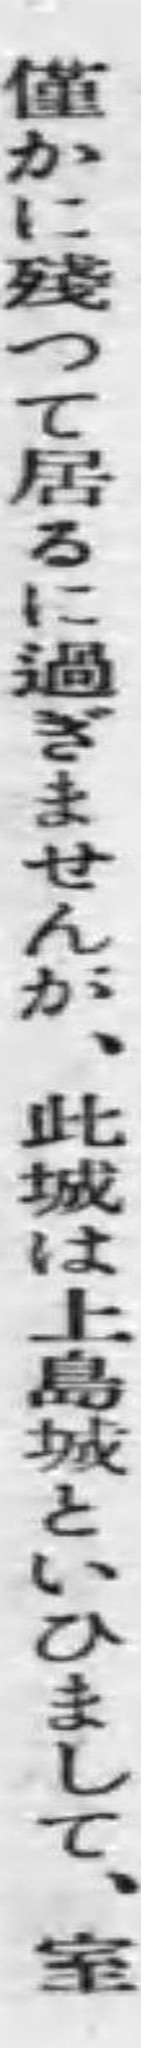僅かに残つて居るに過ぎませんが、此城は上島城といひまして、室
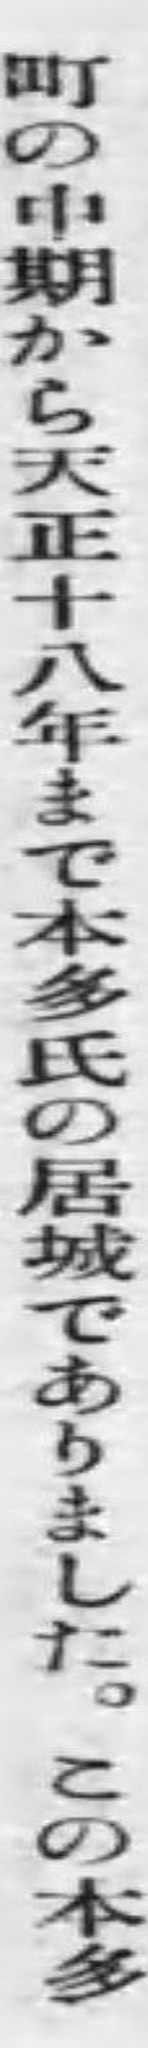町の中期から天正十八年まで本多氏の居城でありました。この本多
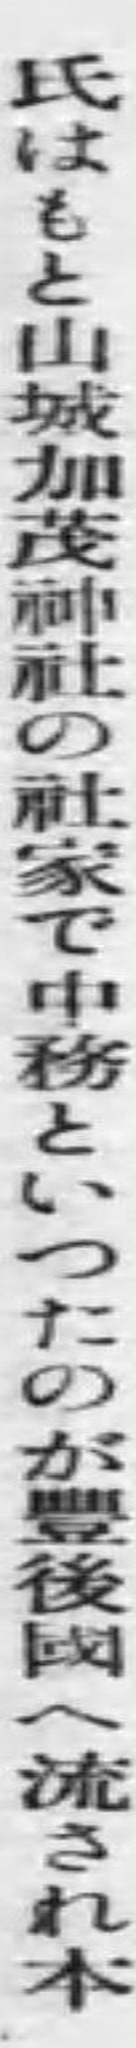氏はもと山城加茂神社の社家で中務といつたのが豊後国へ流され本
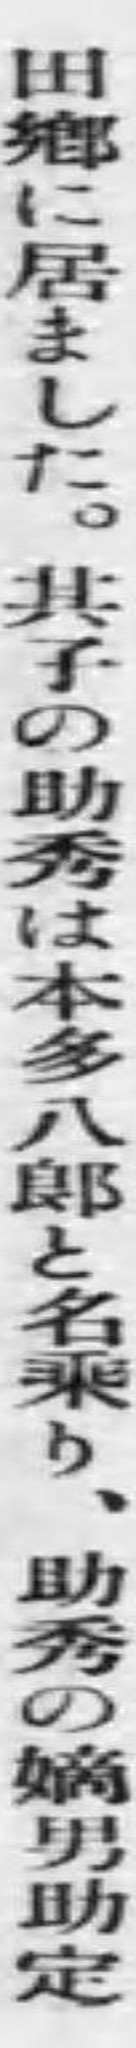田郷に居ました。其子の助秀は本多八郎と名乗り、助秀の嫡男助定
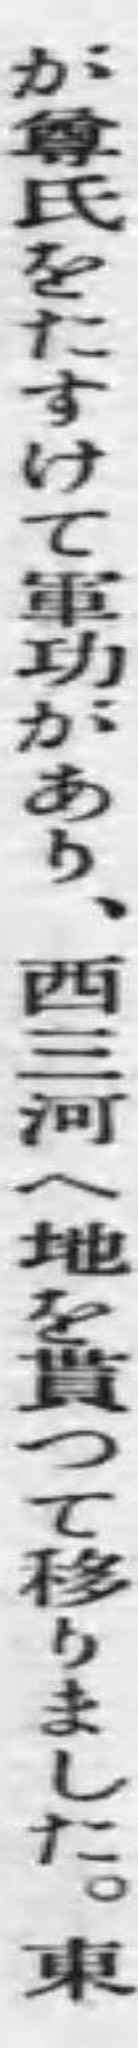が尊氏をたすけて軍功があり、西三河へ地を貰つて移りました。東
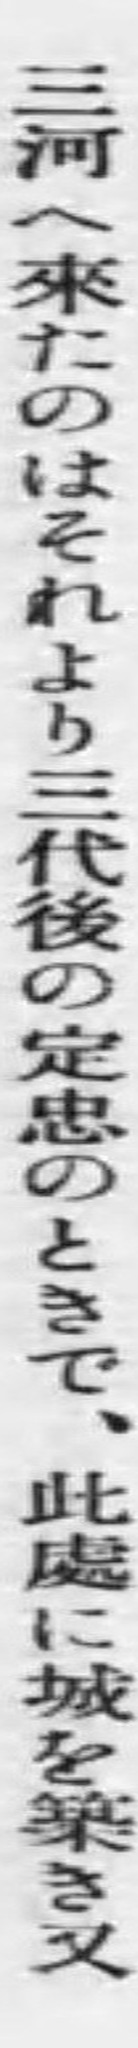三河へ来たのはそれより三代後の定忠のときで、此処に城を築き又
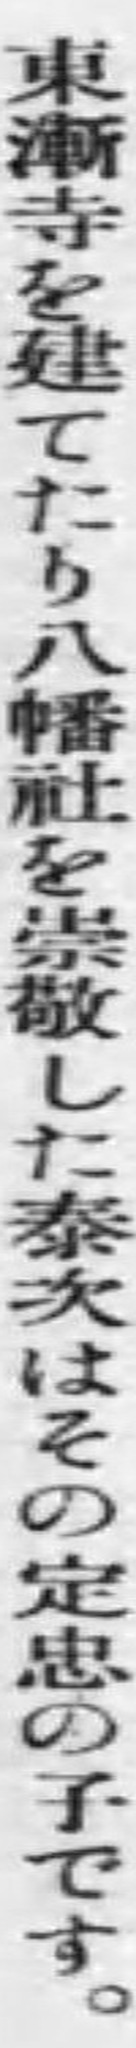東漸寺を建てたり八幡社を崇敬した泰次はその定忠の子です。
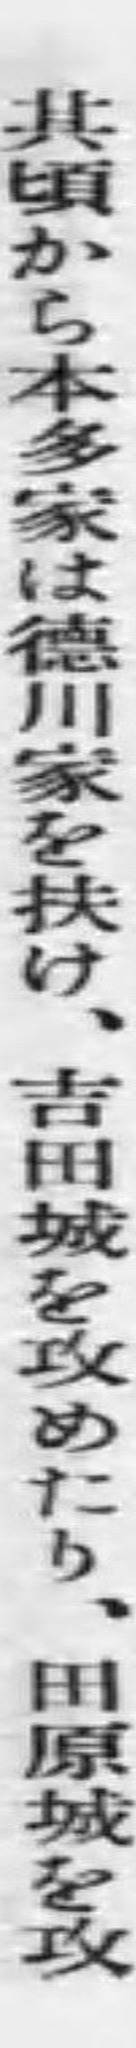其頃から本多家は徳川家を扶け、吉田城を攻めたり、田原城を攻
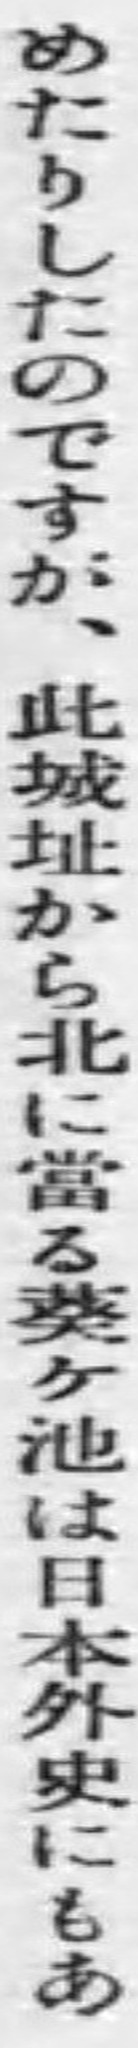めたりしたのですが、此城址から北に当る葵ヶ池は日本外史にもあ
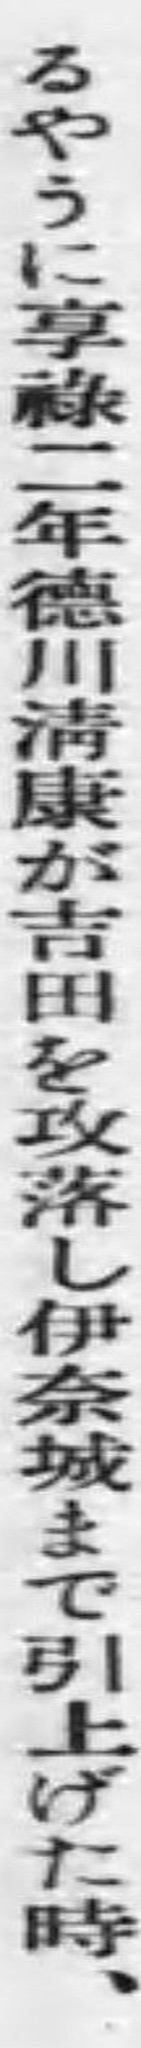るやうに享禄二年徳川清康が吉田を攻落し伊奈城まで引上げた時、
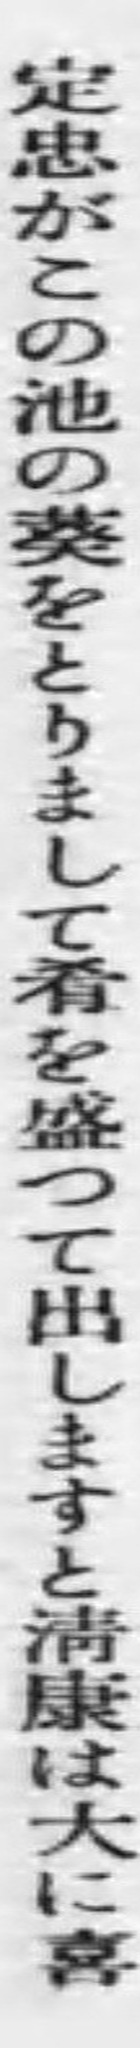定忠がこの池の葵をとりまして肴を盛つて出しますと清康は大に喜
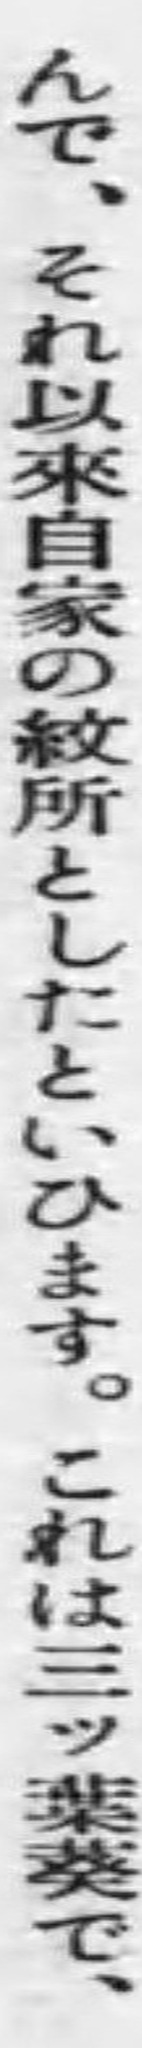んで、それ以来自家の紋所としたといひます。これは三ッ葉葵で、
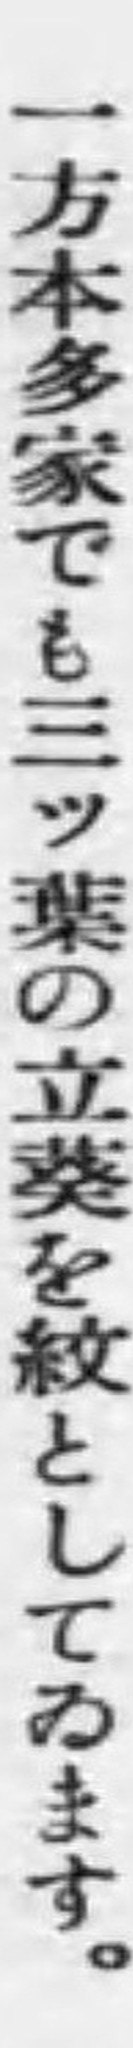一方本多家でも三ッ葉の立葵を紋としてゐます。
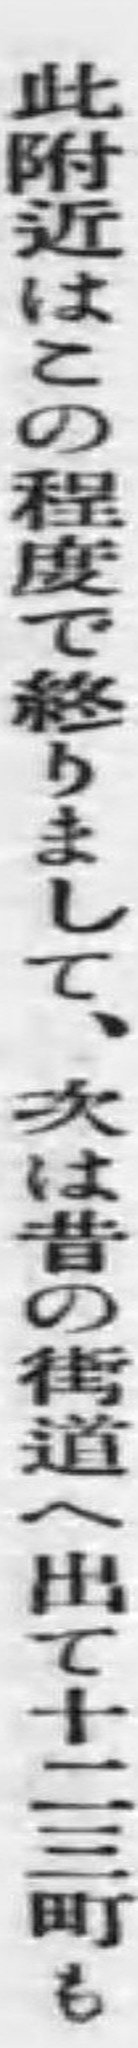此附近はこの程度で終りまして、次は昔の街道へ出て十二三町も
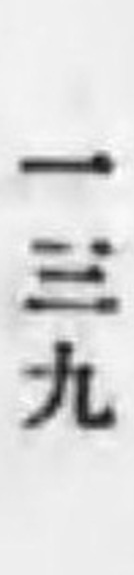一三九
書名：東三河道中記 : 豊橋市及其附近案内
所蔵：国立国会図書館 National Diet Library, JAPAN
